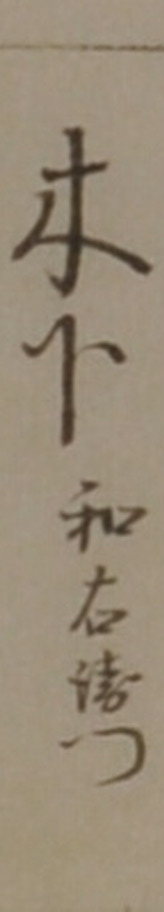佐藤木下和右衛門
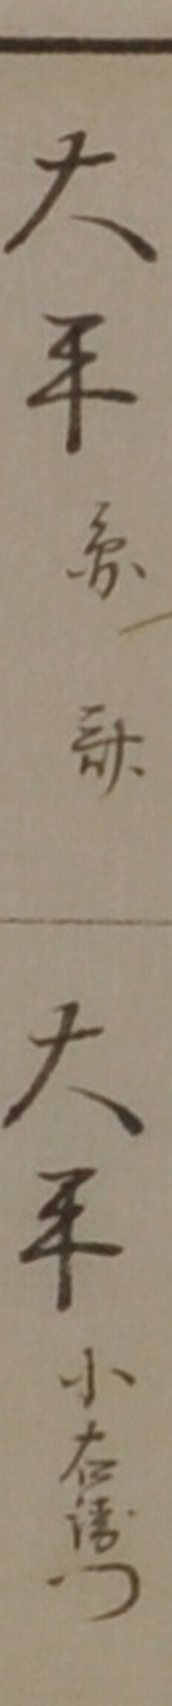大平円斉大平小右衛門

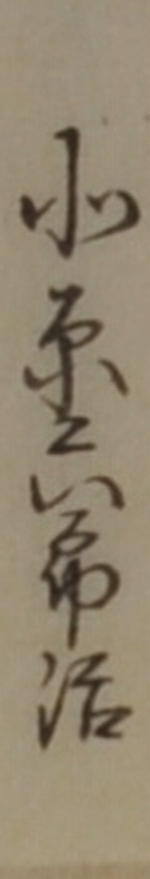北原六郎治
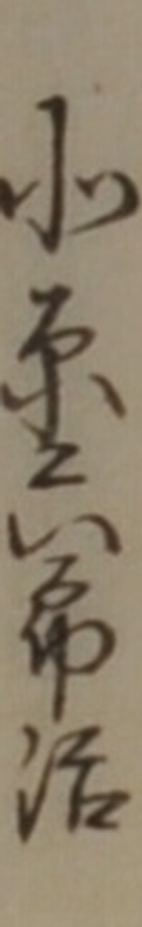北原六郎治

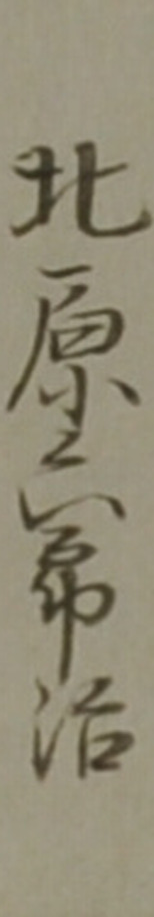北原六郎治
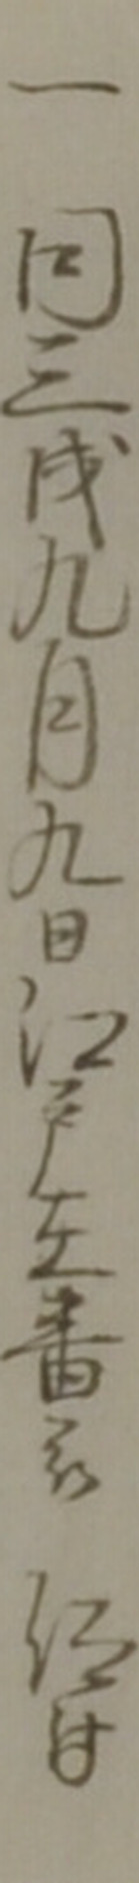一同三戌九月九日江戸在番被仰付
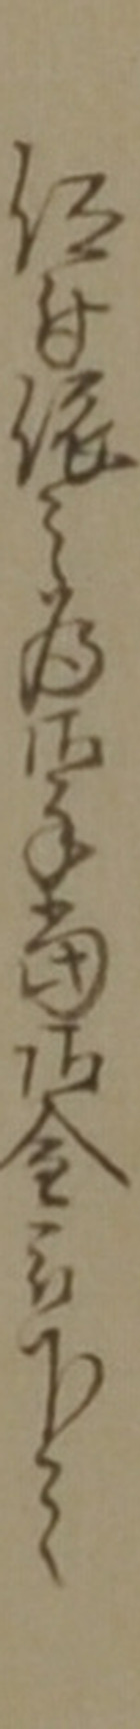仰付依之為御手当御金被下候

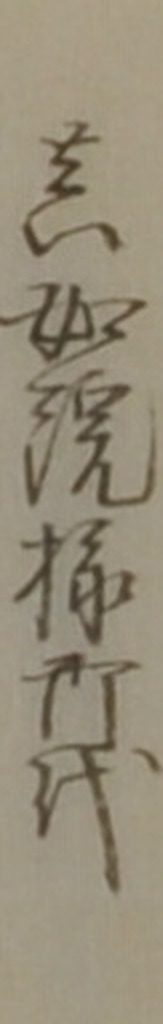真如院様御代
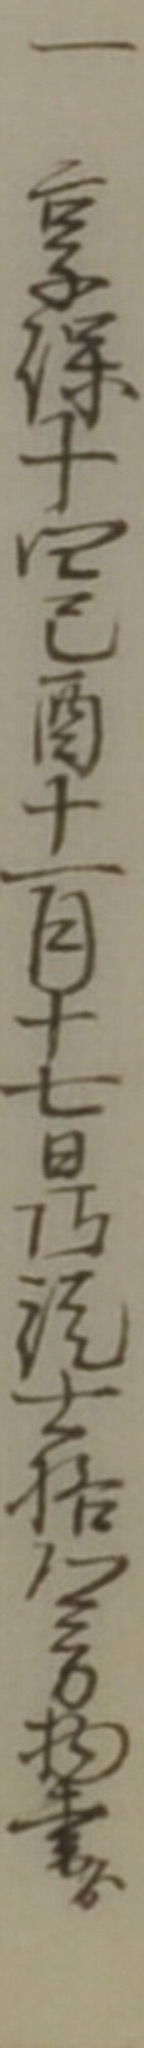一享保十四己酉十一月十七日御徒士格郷方物書ゟ
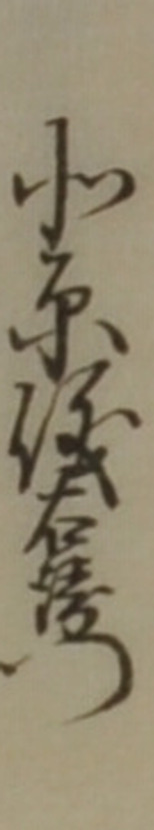北原儀右衛門
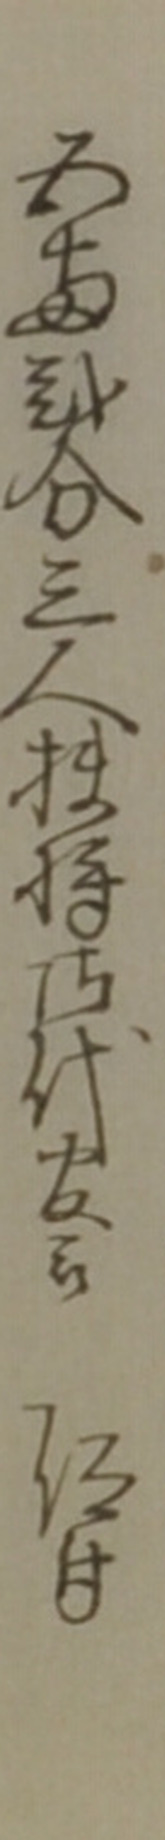五両弐分三人扶持御代官被仰付
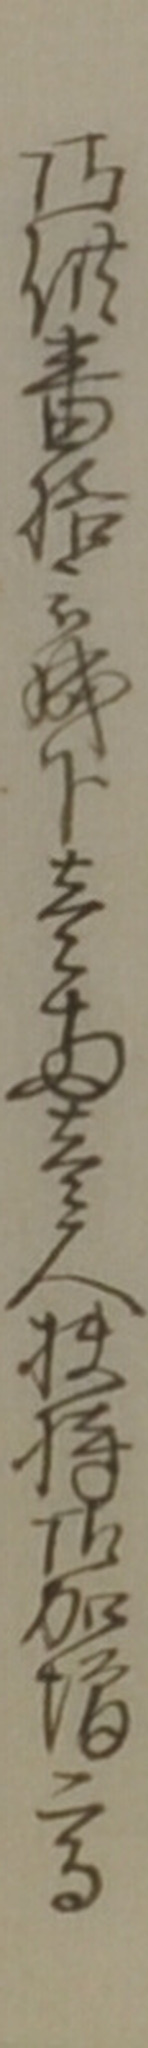御供番格被成下壱両壱人扶持御加増高
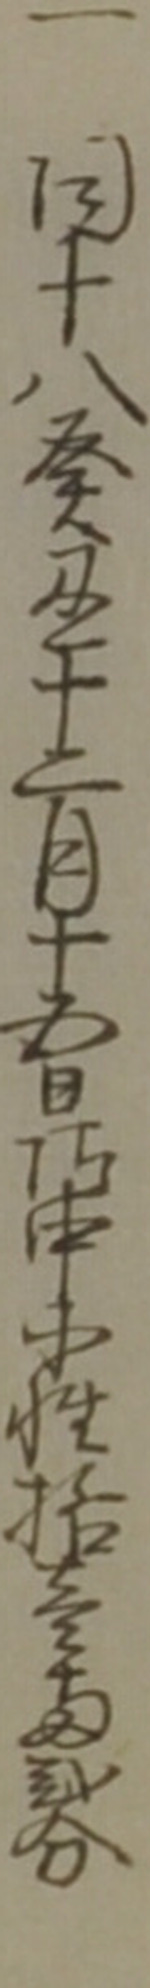一同十八癸丑十二月十五日御中小性格壱両弐分
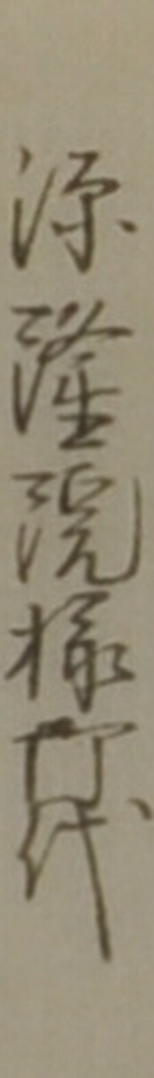源隆院様御代
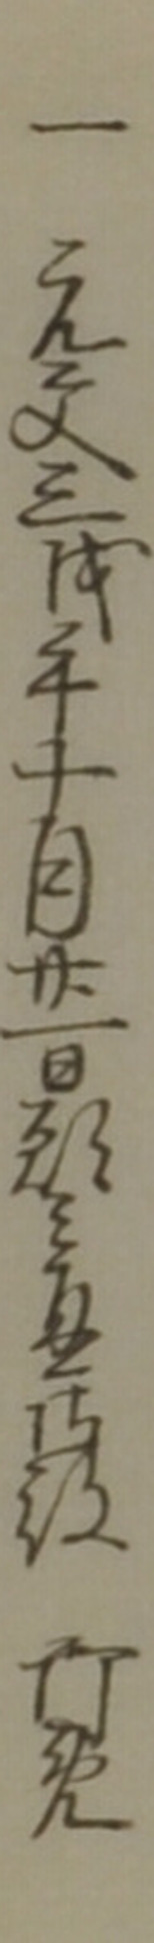一元文三戊午十月廿一日願之通御役御免
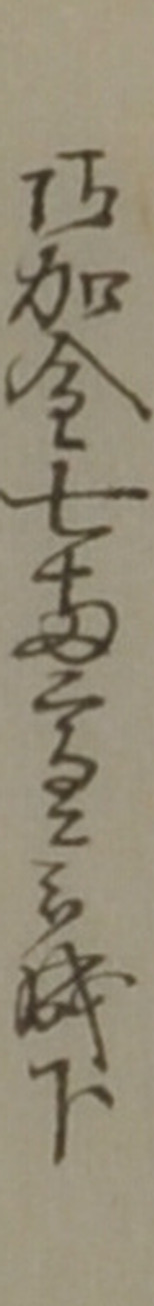御加金七両高ニ被成下
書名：無足諸士勤仕録（六）
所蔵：伊那市立高遠町図書館・合同会社AMANE
